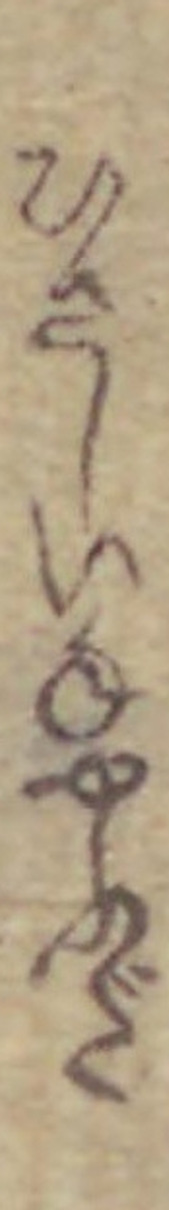ひさしいねやふだ
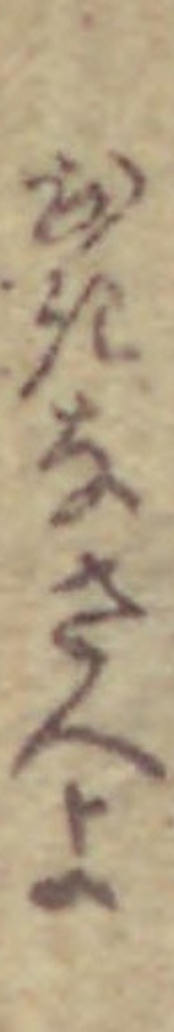おきなさへよ
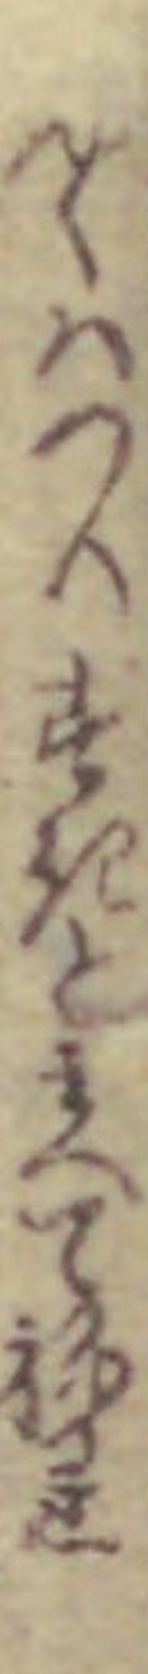はつりすきとみへてねると
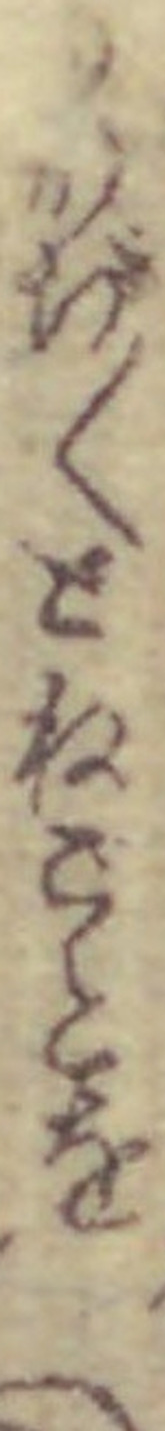かぢ〳〵とねごとを
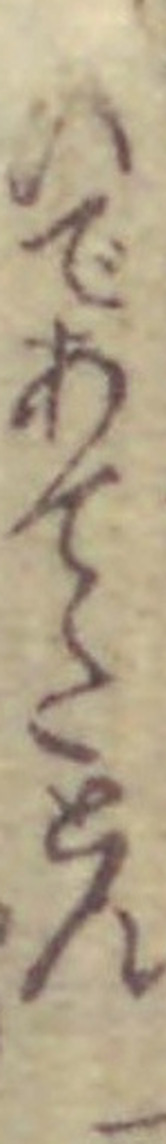いであてたとん
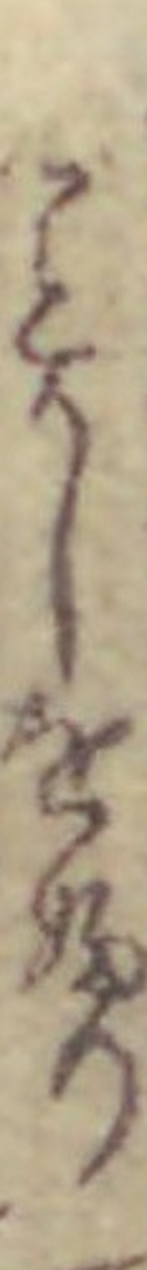とかしをふり
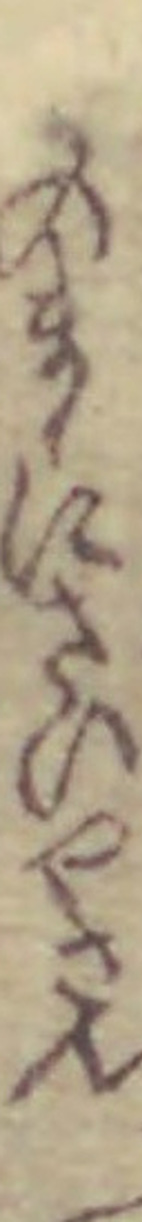のまゝにさいやさん
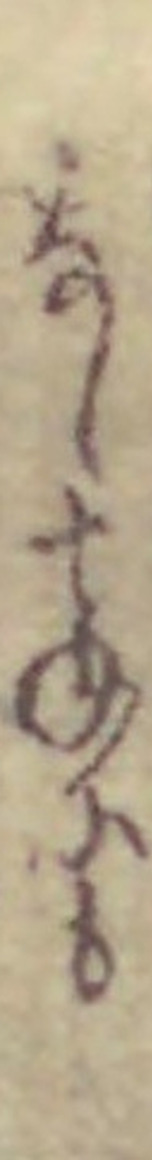なし十年にも
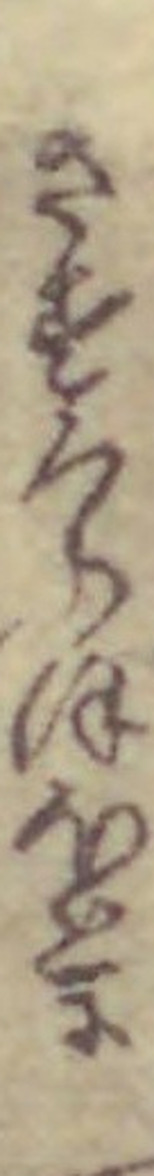きすくふほほとに
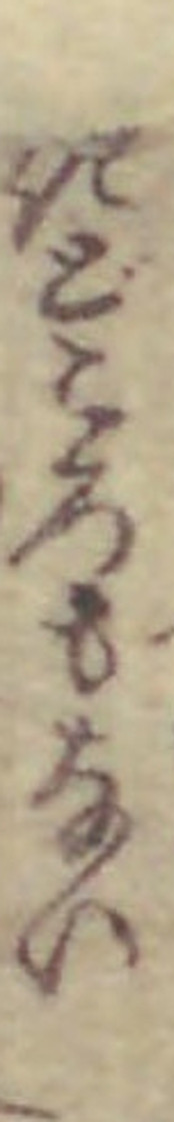どころもない
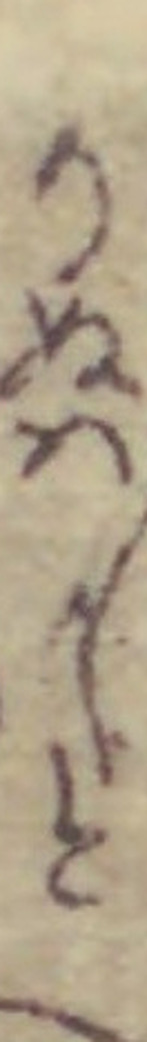りぬは〳〵と
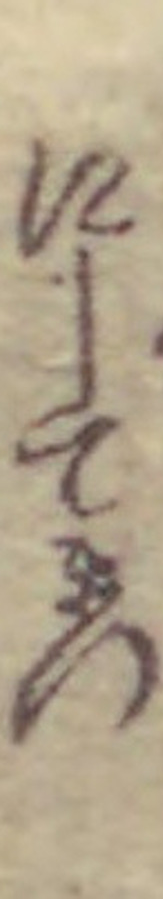にしてまつ
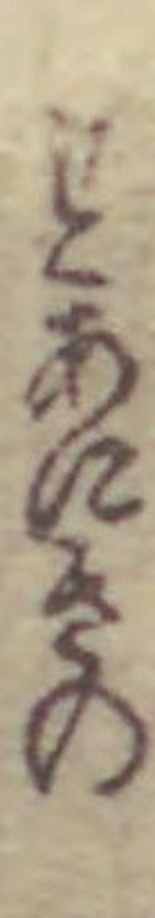とあにきの
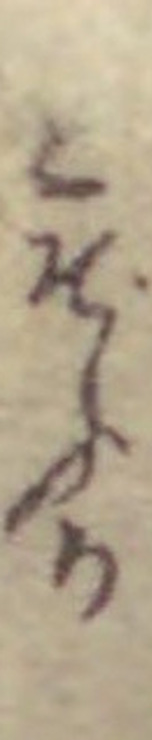こそふか
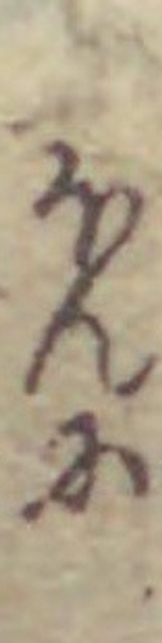ほんに
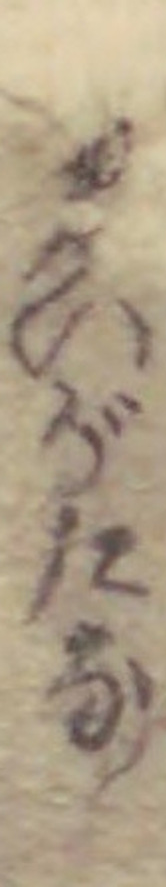やいがたな
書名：思事夢濃枕 3巻
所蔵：国立国会図書館 National Diet Library, JAPAN
